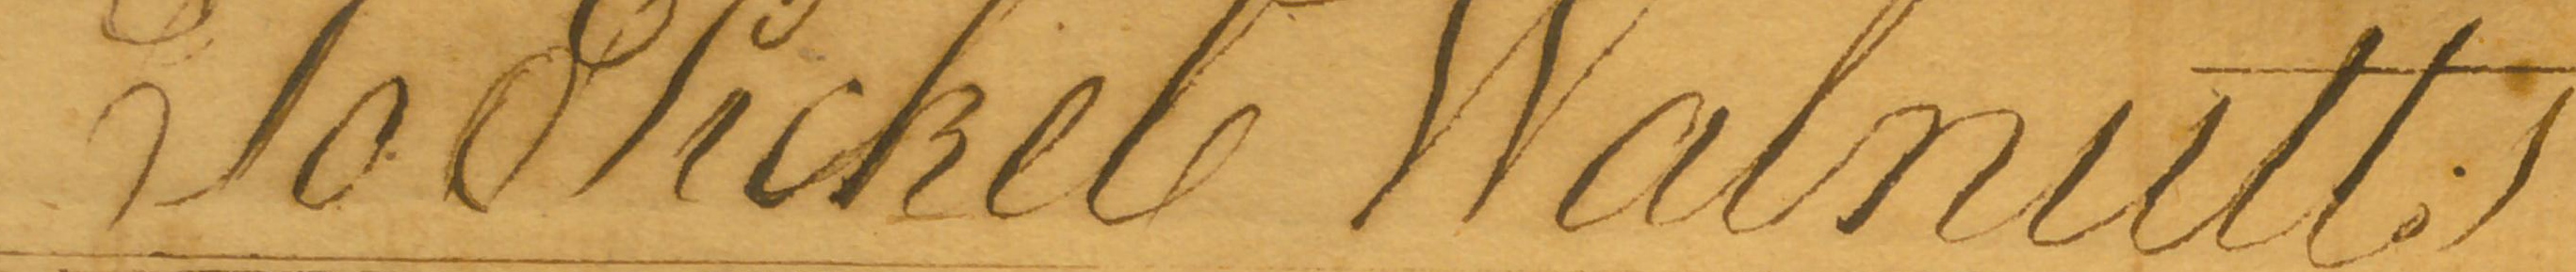To Pickel Walnutts
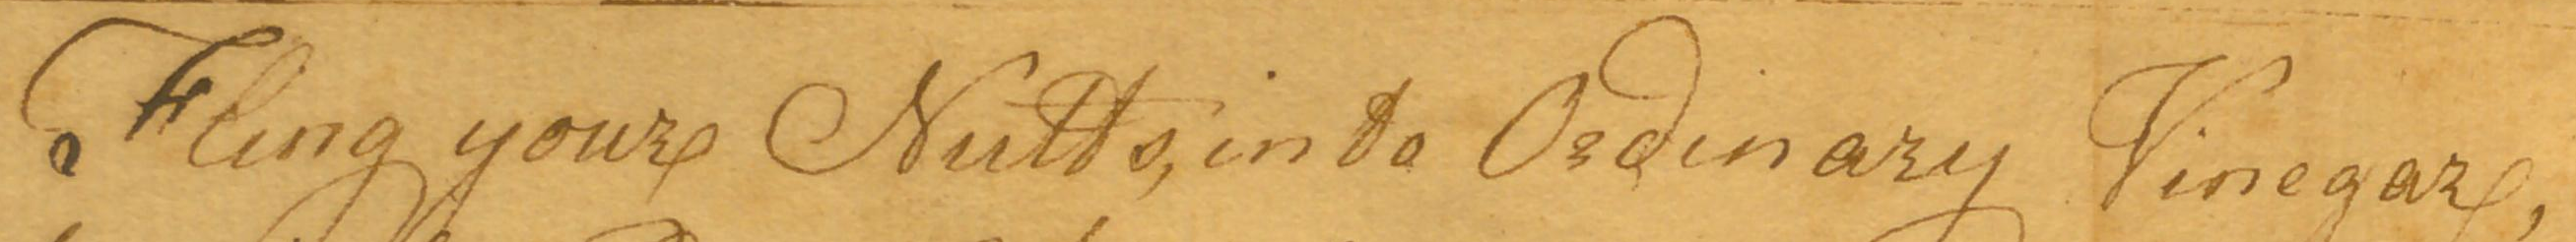Fling your Nutts, into Ordinary Vinegar
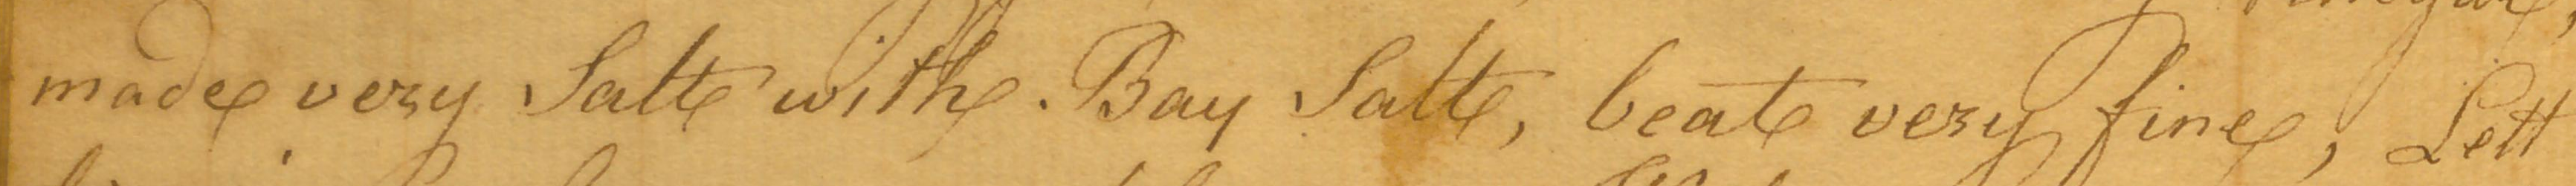made very Salt with Bay Salt, beat very fine, Lett
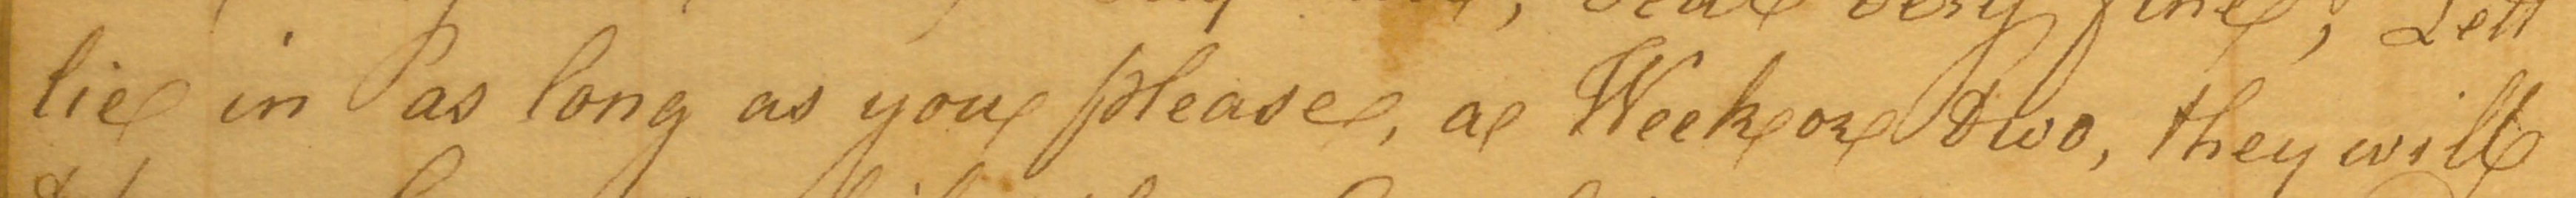tie in as long as you please, a Week or two, they will
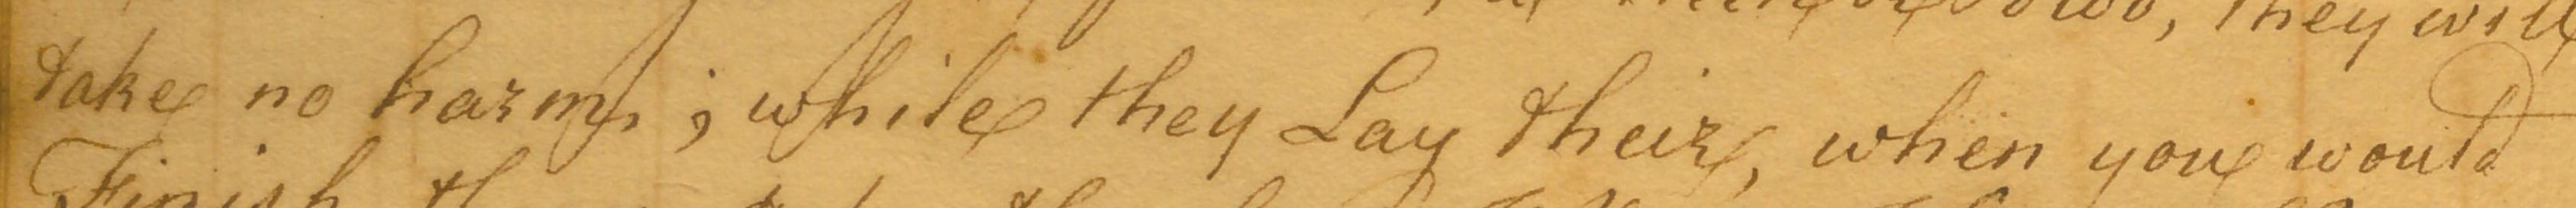take no harm; while they Lay their, when you would
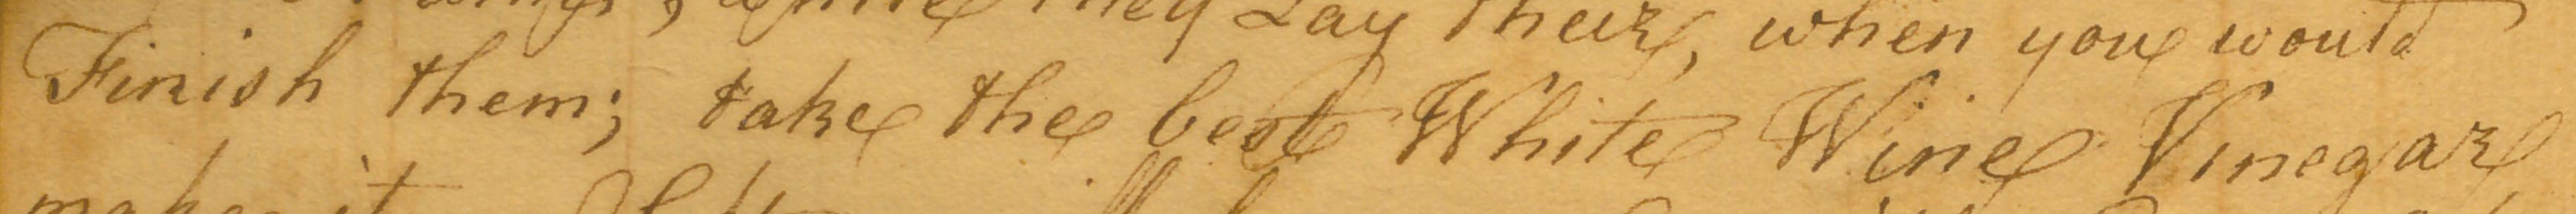Finish them; take the best White Wine Vinegar
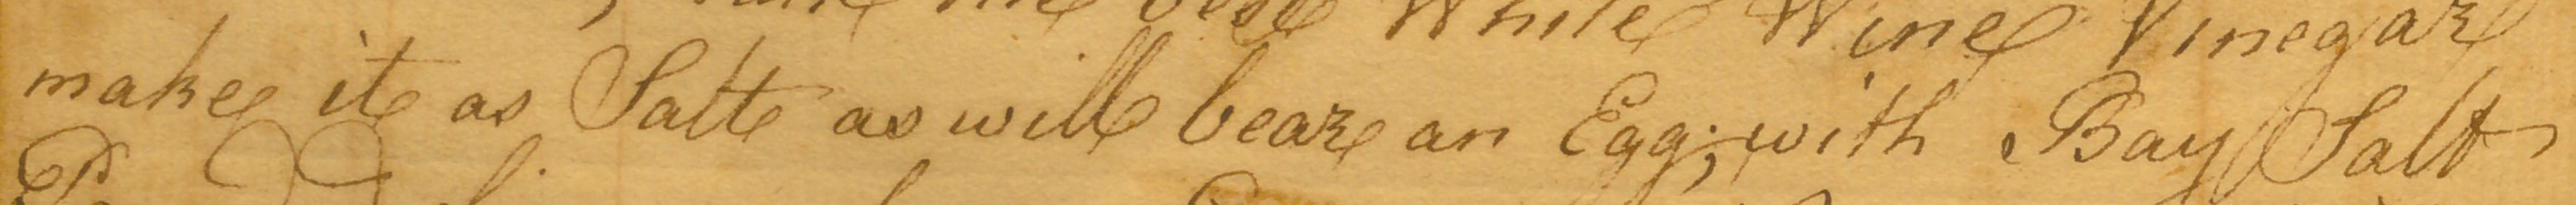make it as Salt as will bear an Egg; with Bay Salt
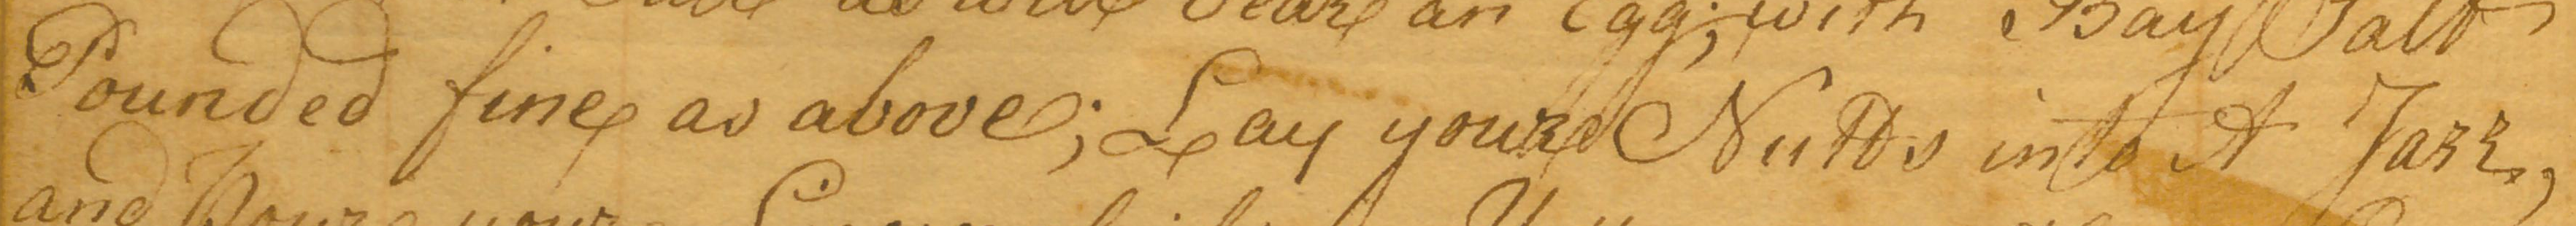Pounded fine as above; Lay your Nutts into A Jarr,
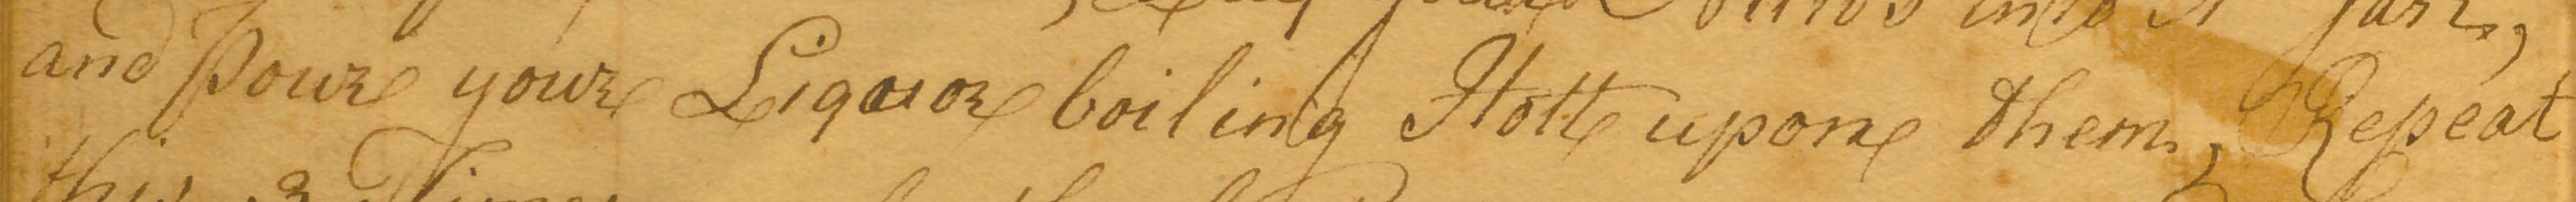and Pour your Liquor boiling Hott upon them, Repeat
